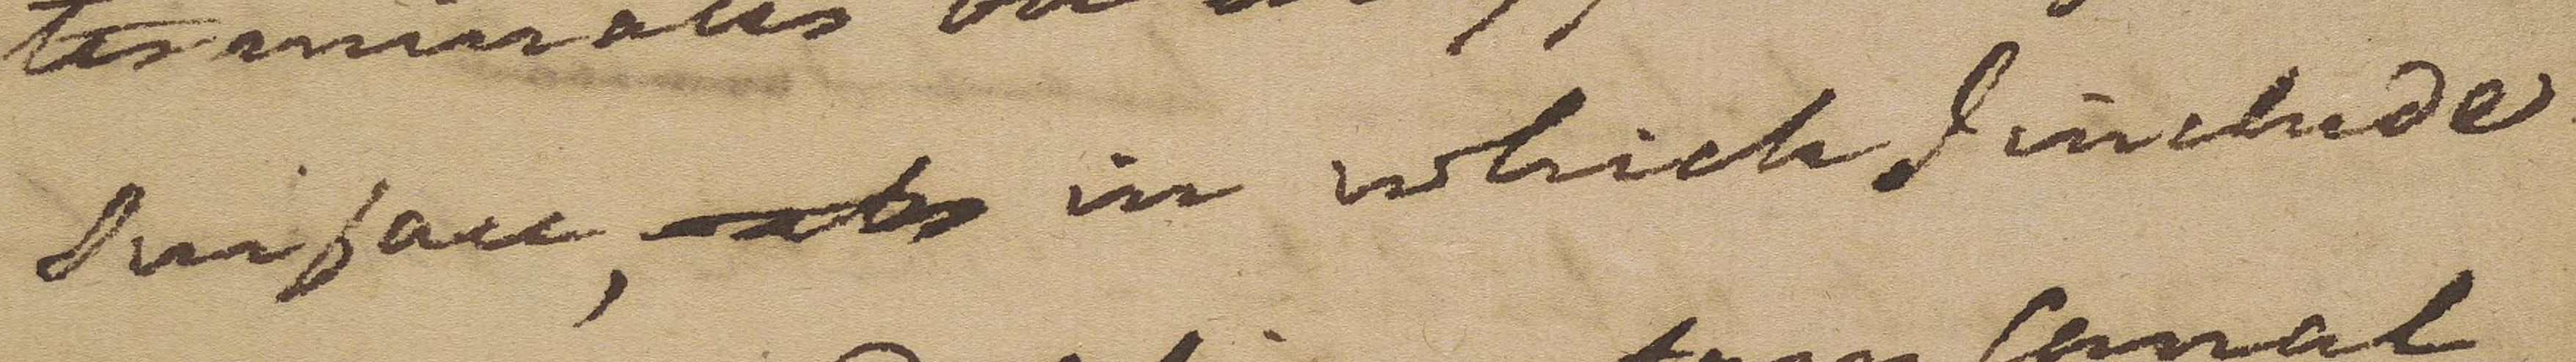surface, in which I include
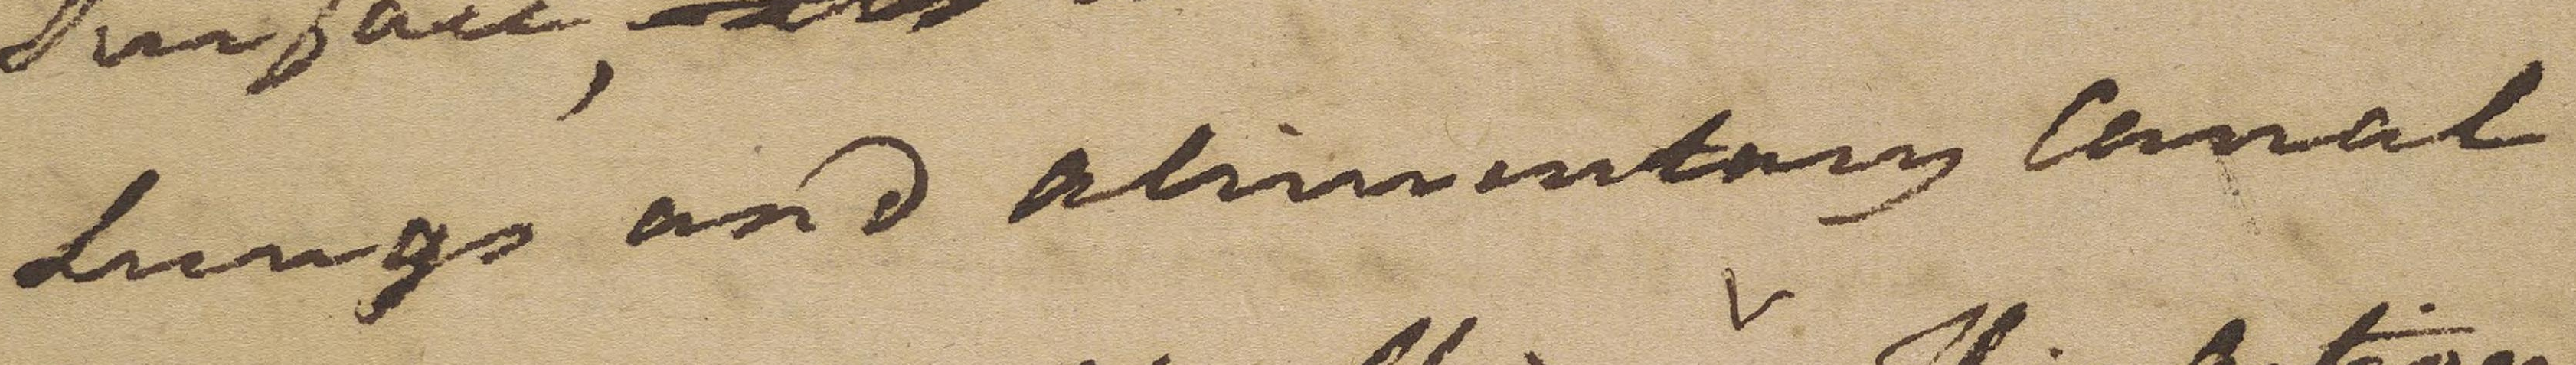lungs and alimentary canal
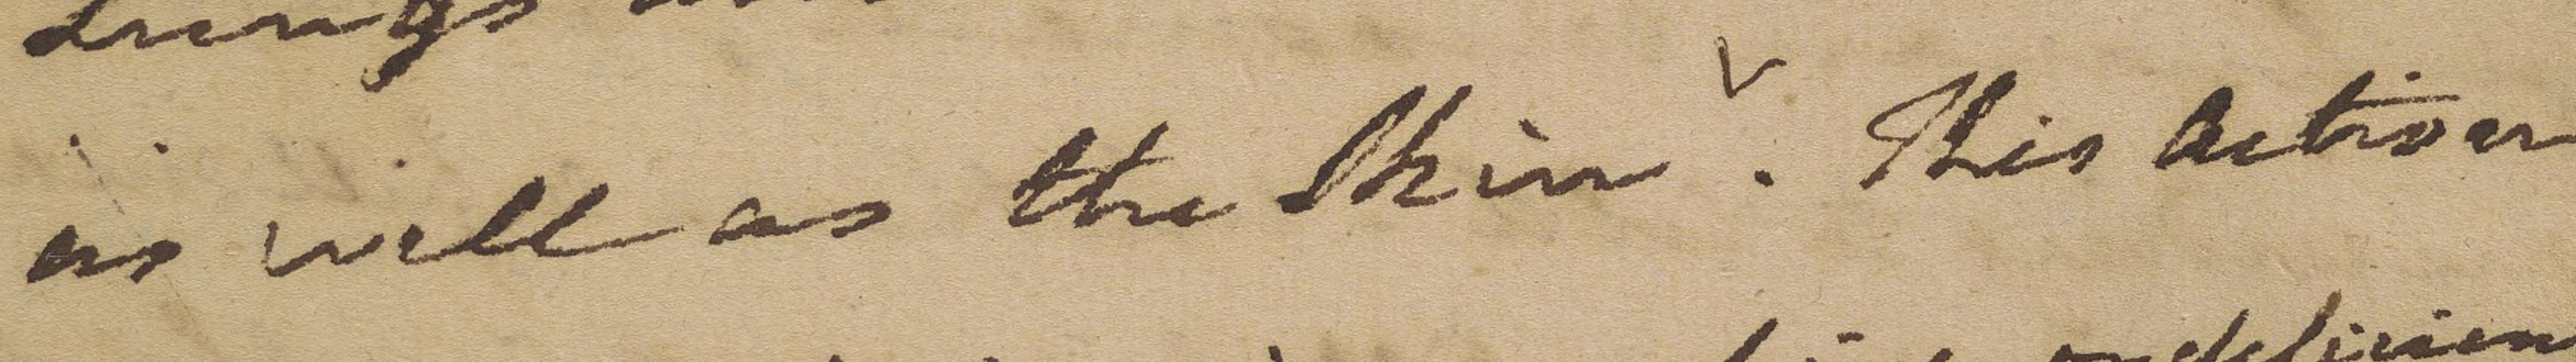as well as the skin. This action
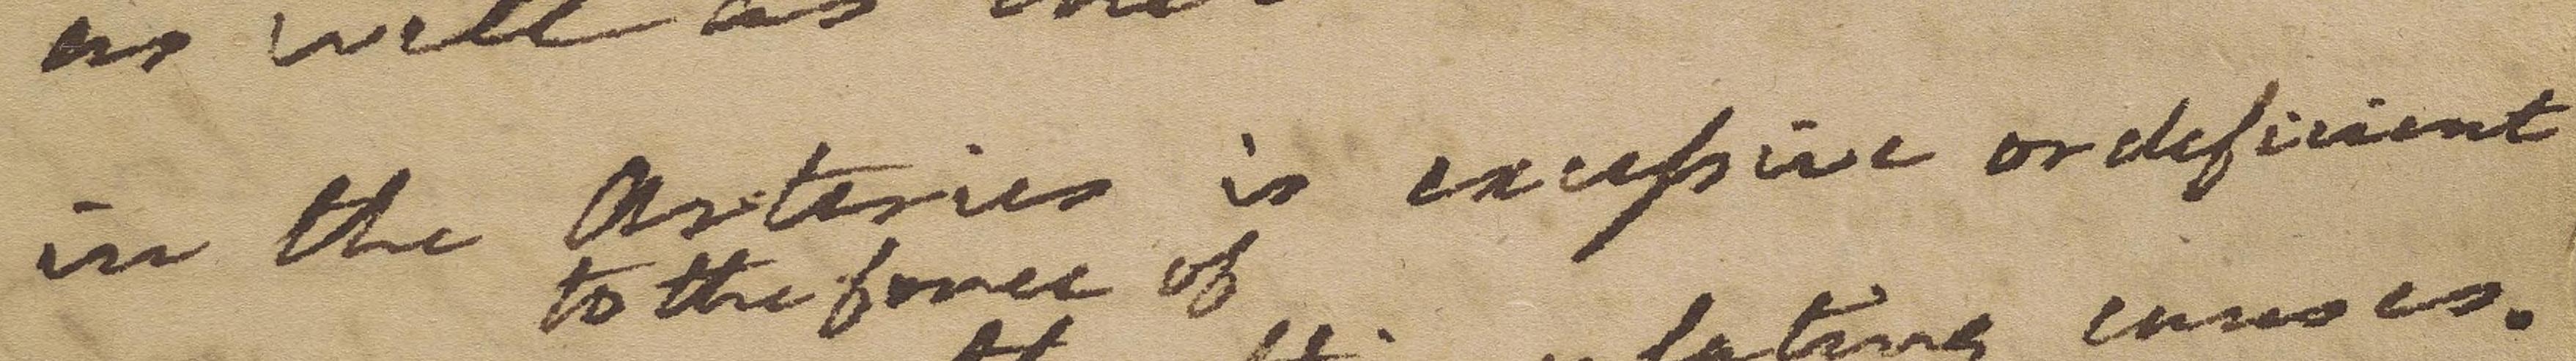in the arteries is excessive or deficient
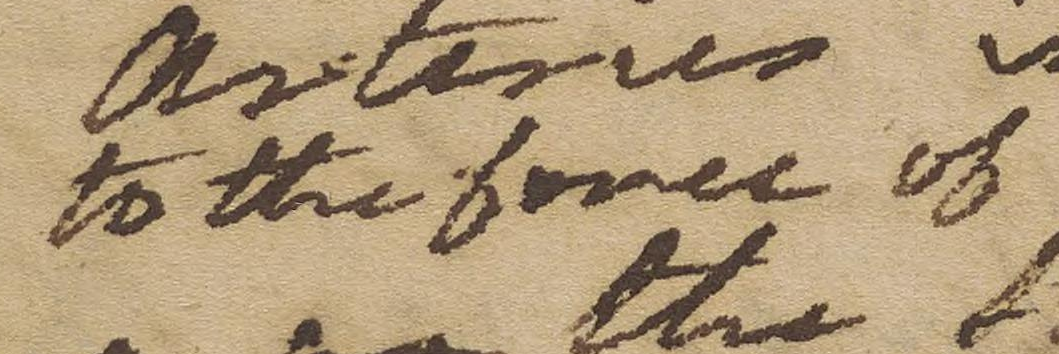to the force of
